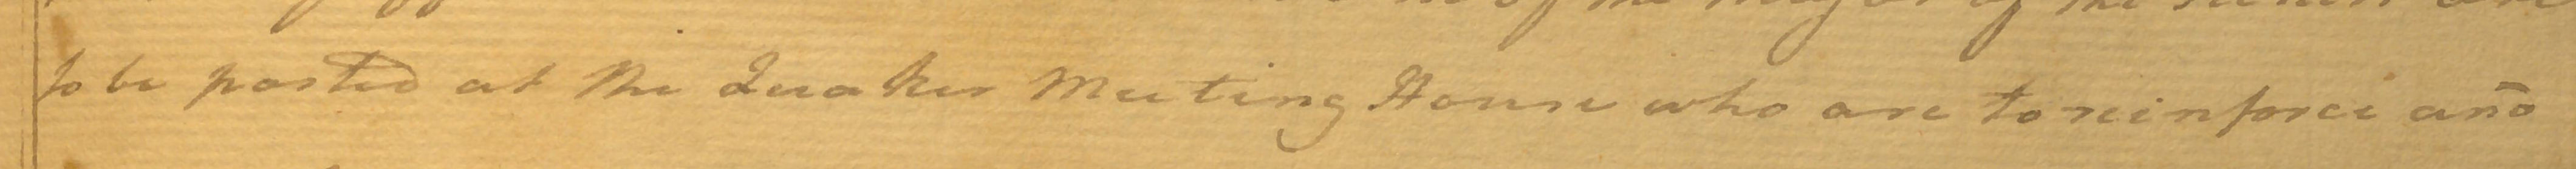to be posted at the Quaker Meeting House who are to reinforce and
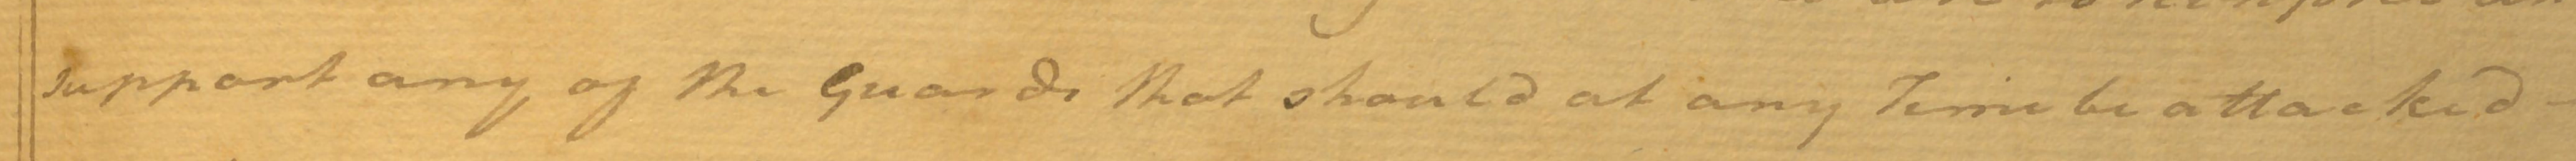support any of the Guards that should at any Time be attacked
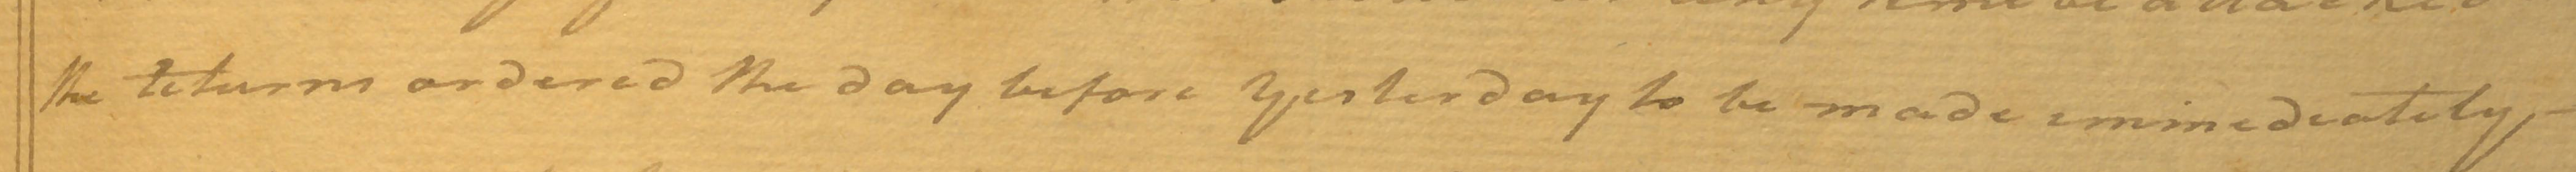the returns ordered the day before Yesterday to be made immediately
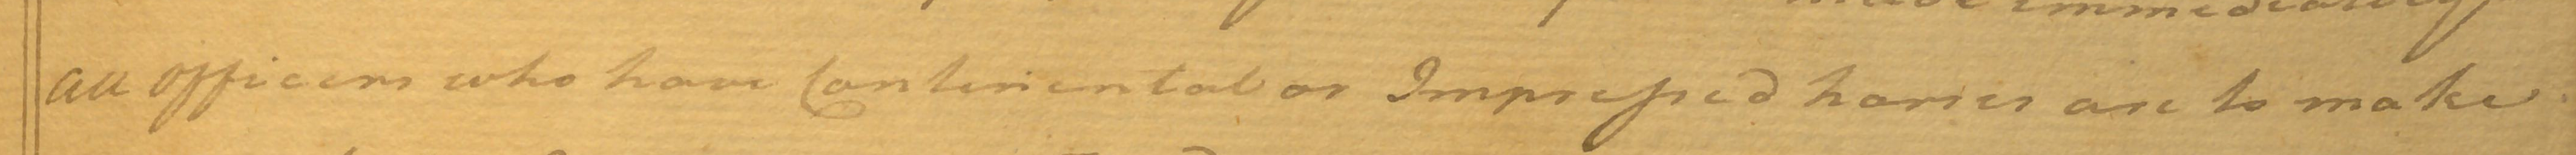All officers who have Continental or Impressed horses are to make
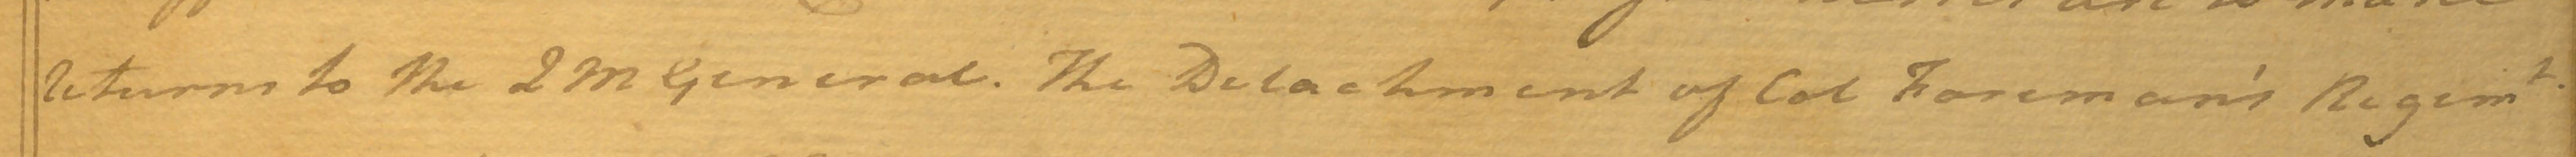returns to the QM General. The Detachment of Col Foreman's Regim^t.
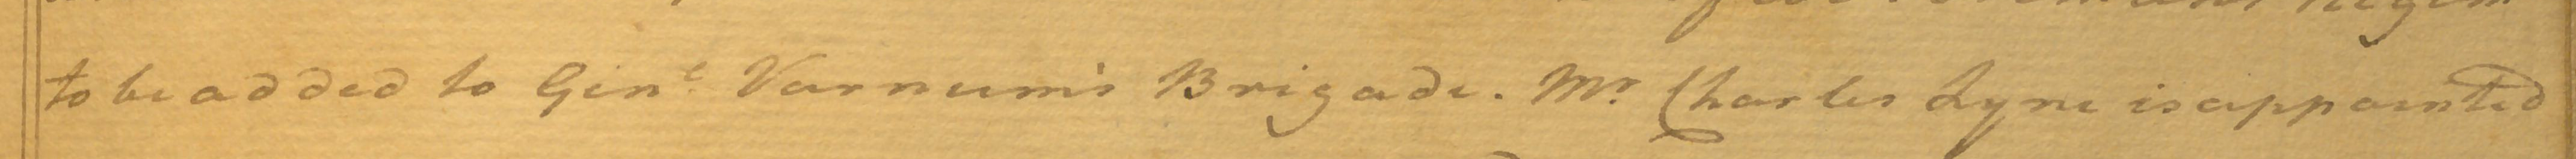to be added to Gen^l. Varnum's Brigade. M^r. Charles Lyne is appointed
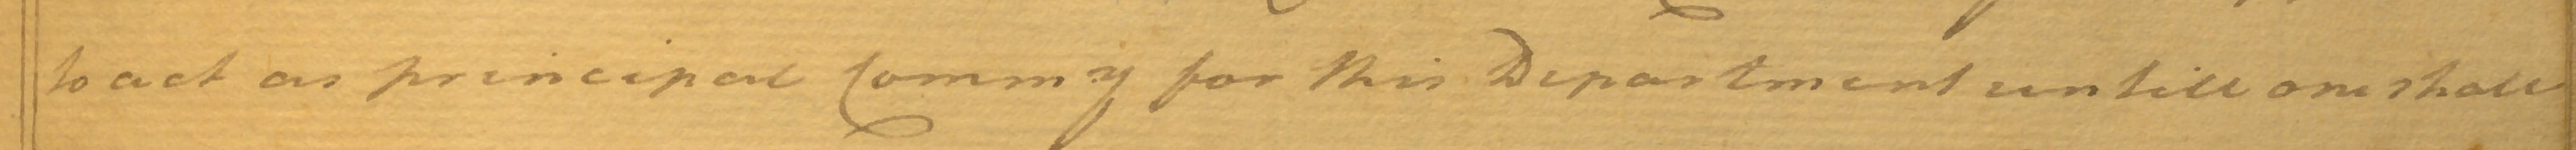to act as principal Comm^y for this Department untill one shall
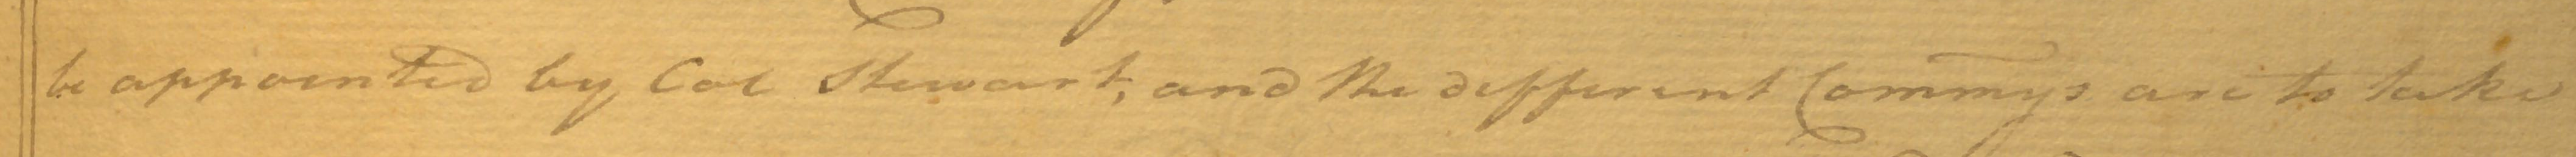be appointed by Col Stewart, and the different Commys are to take
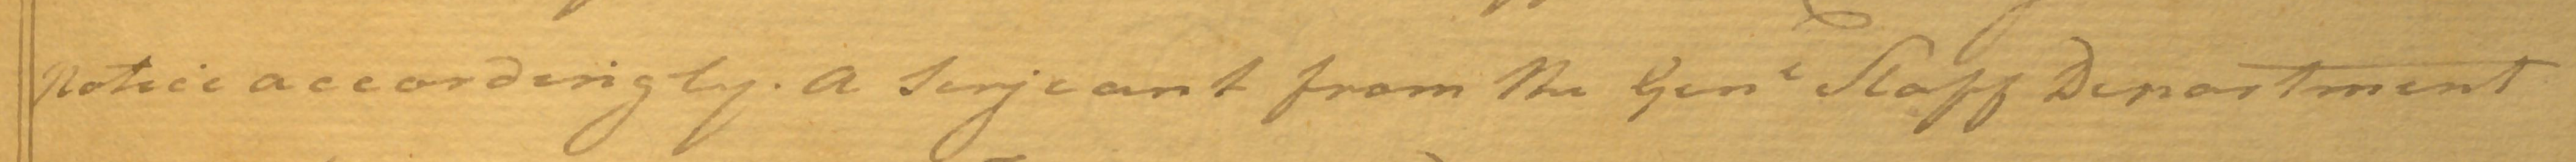notice accordingly. A Serjeant from the Gen^l Staff Department
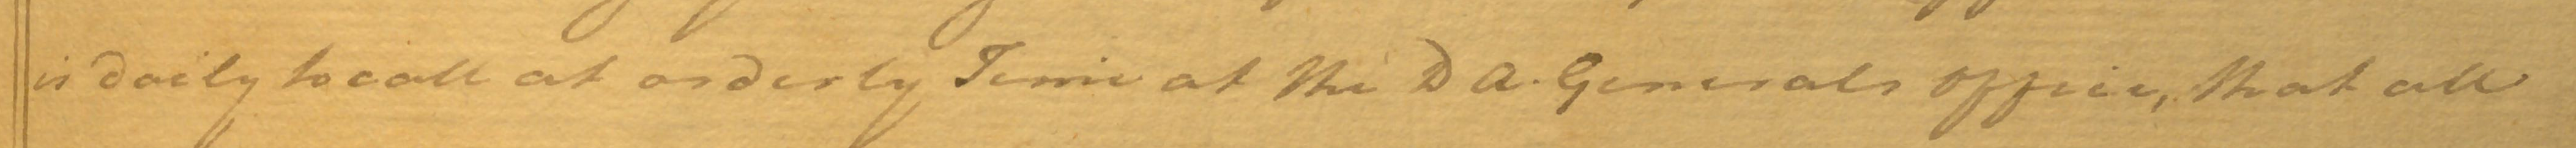is daily to call at orderly Time at the DA. Generals Office, that all
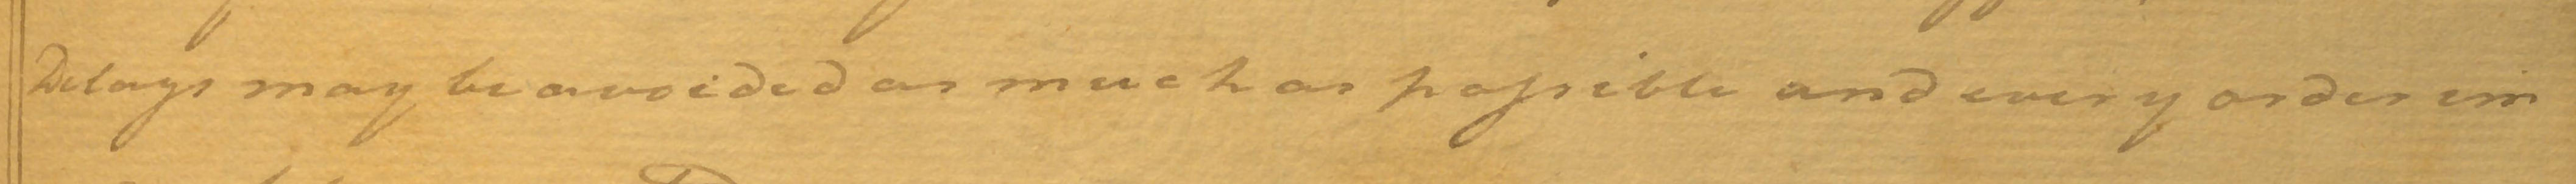Delays may be avoided as much as possible and every order im
